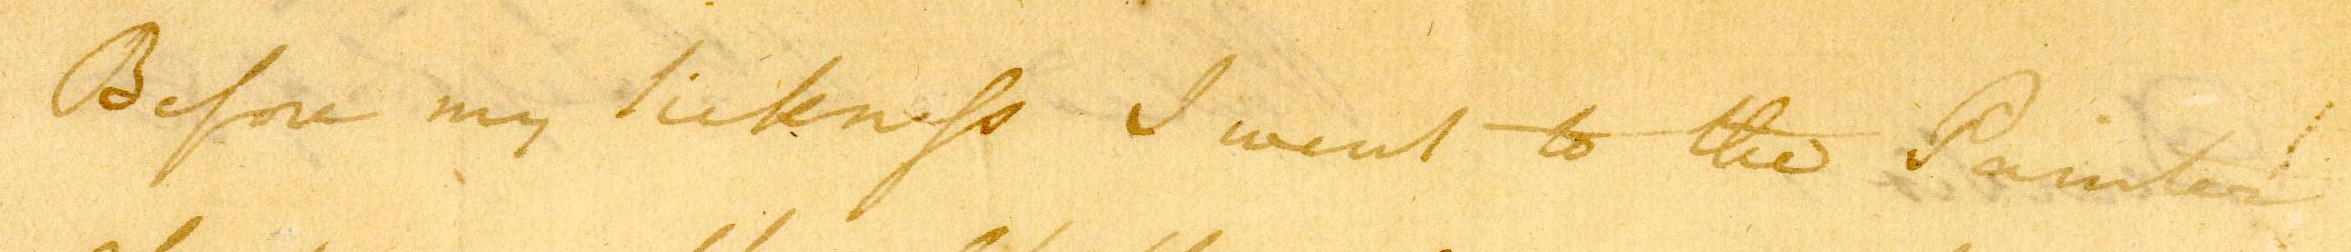Before my Sickness I went to the Painters
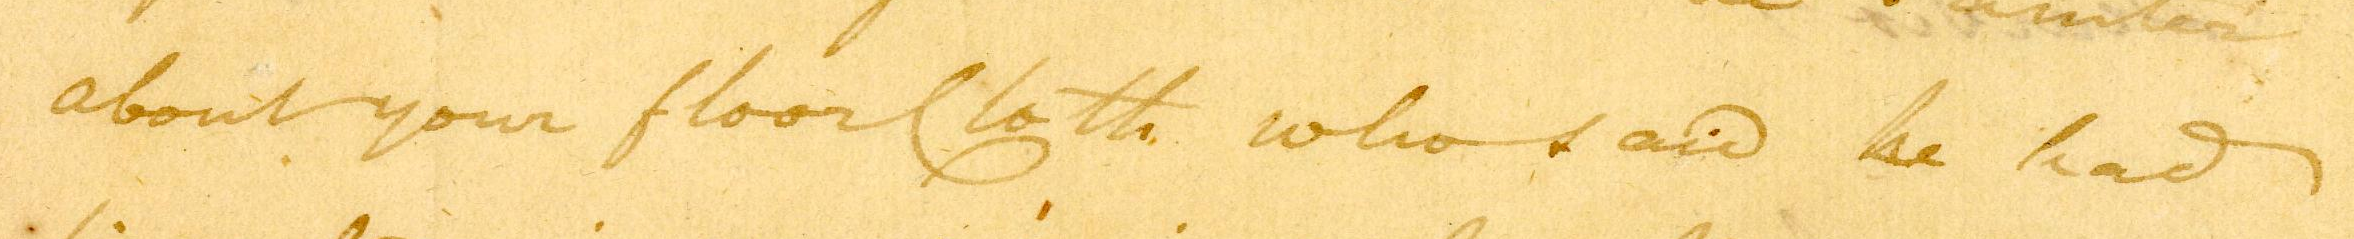about your floor Cloth who said he had
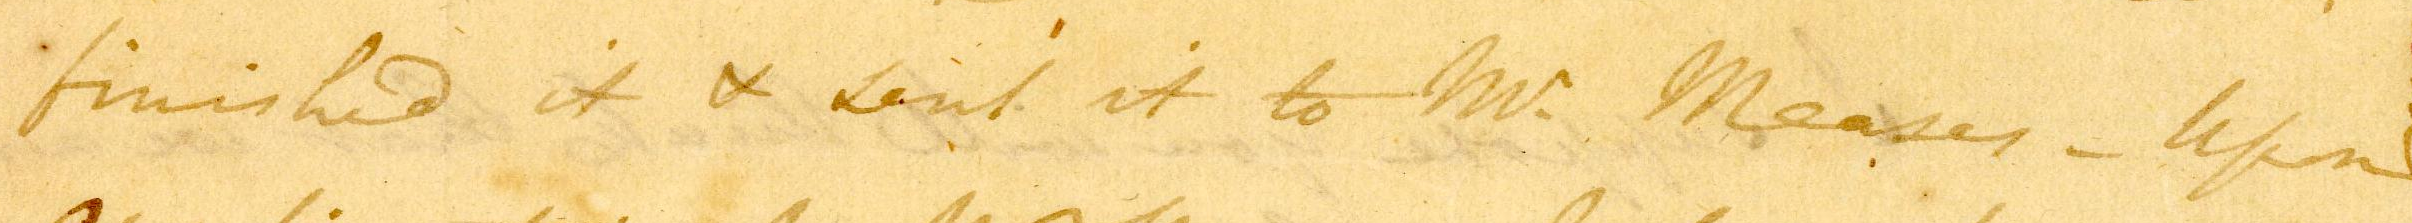finished it & sent it to M^r. Meases- Upon
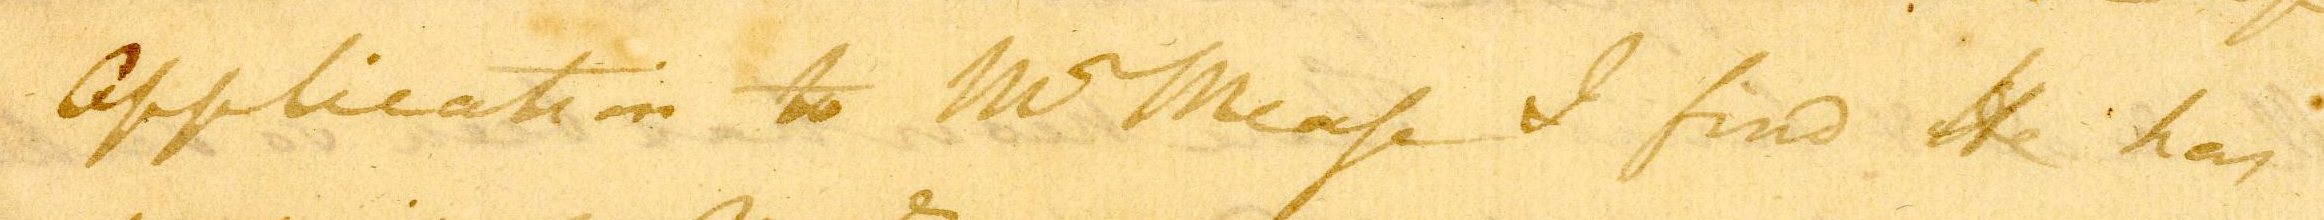Application to M^ Mease I find He has
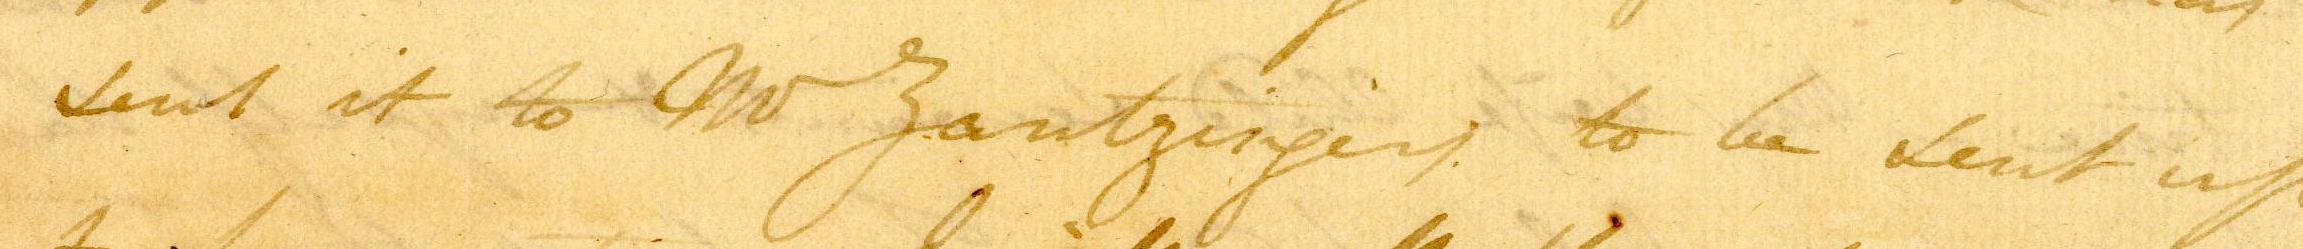sent it to M^r Zantzingers to be sent up
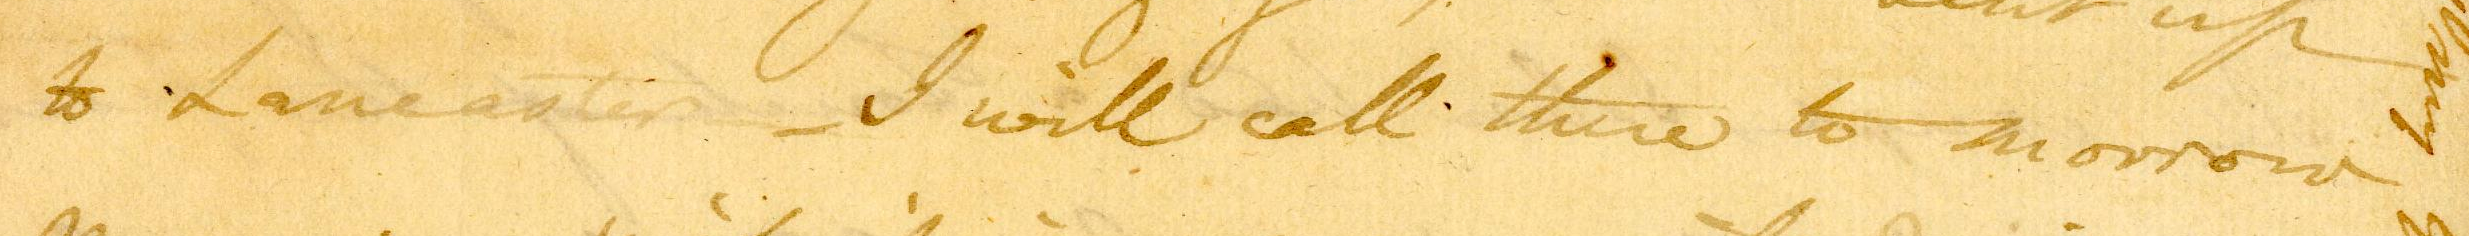to Lancaster. I will call there tomorrow
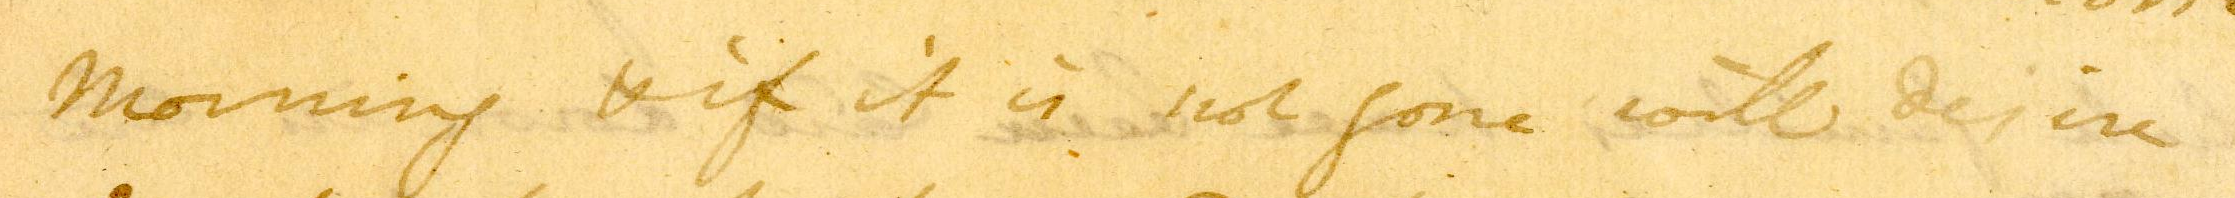morning & if it is not gone will desire
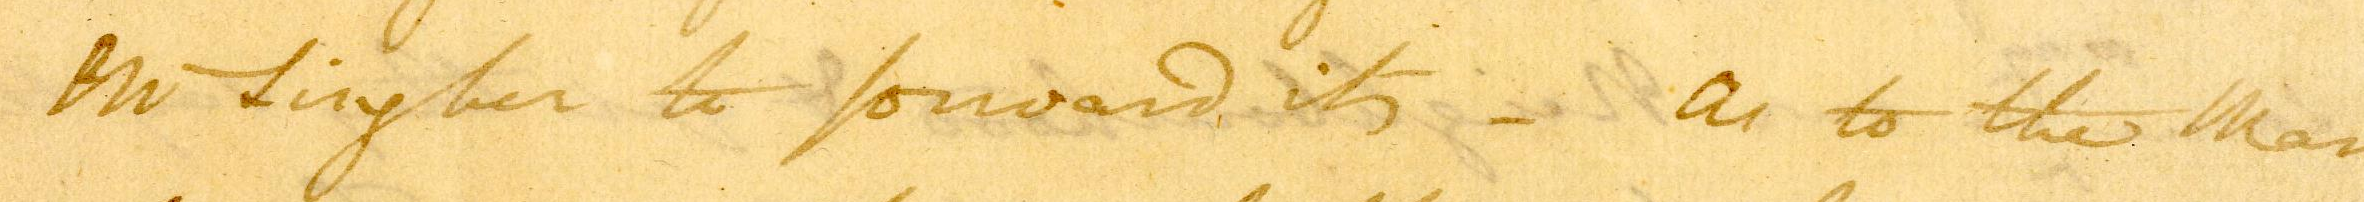W. Lingher to forward it. As to the Man
